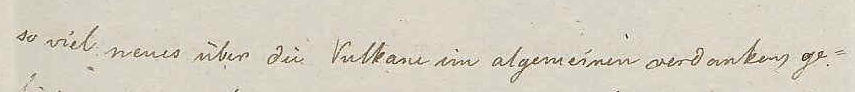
so viel neues über die Vulkane im algemeinen verdanken, ge-
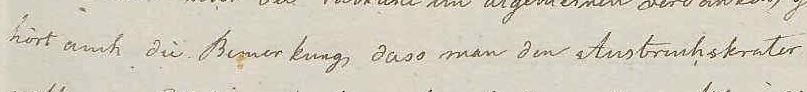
hört auch die Bemerkung, dass man den Ausbruchskrater
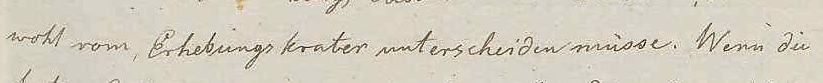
wohl vom Erhebungskrater unterscheiden müsse. Wenn die
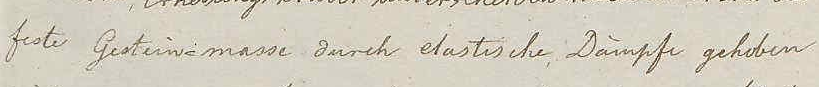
feste Gestein-masse durch elastische Dämpfe gehoben
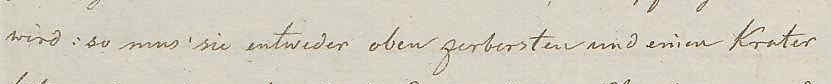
wird: so mus sie entweder oben zerbersten und einen Krater
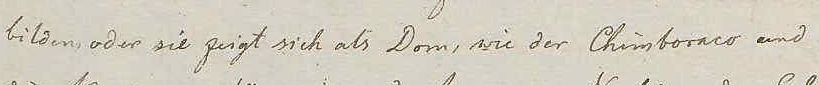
bilden oder sie zeigt sich als Dom, wie der Chimboraco und
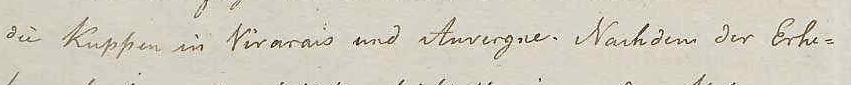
die Kuppen in Vivarais und Auvergne. Nachdem der Erhe-
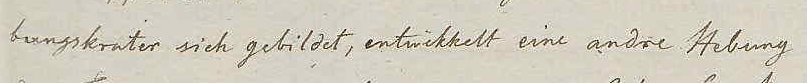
bungskrater sich gebildet, entwikkelt eine andre Hebung
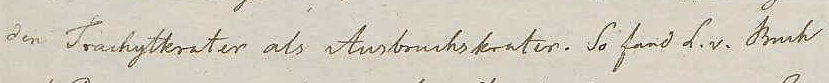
den Trachytkrater als Ausbruchskrater. So fand L. v. Buch
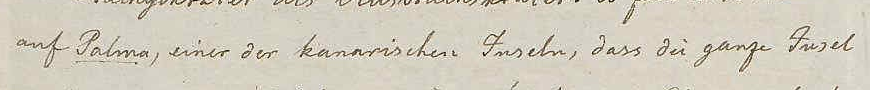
auf Palma, einer der kanarischen Inseln, dass die ganze Insel
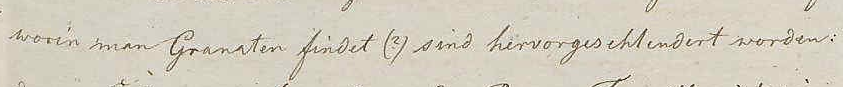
worin man Granaten findet sind hervorgeschleudert worden:
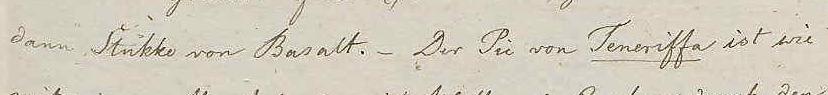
dann Stükke von Basalt. – Der Pic von Teneriffa ist wie
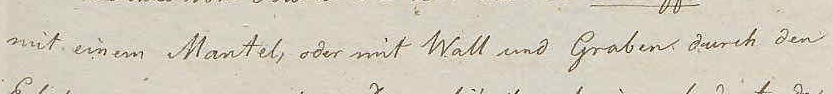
mit einem Mantel, oder mit Wall und Graben durch den
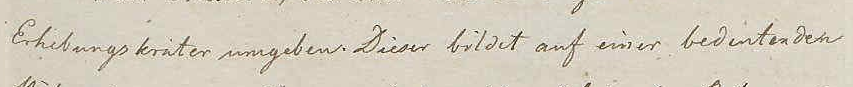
Erhebungskrater umgeben. Dieser bildet auf einer bedeutenden
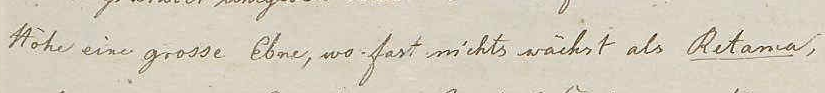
Höhe eine grosse Ebne, wo fast nichts wächst als Retama,
